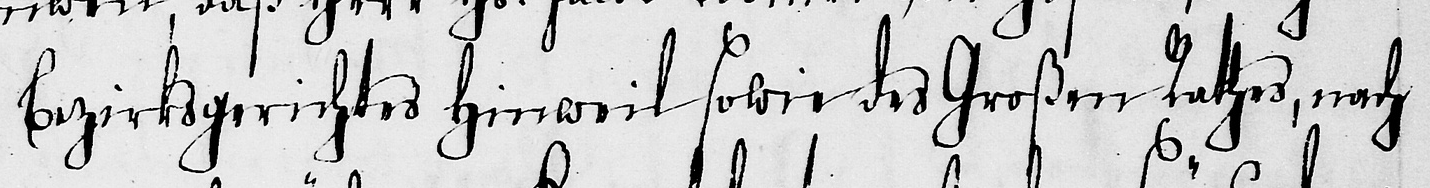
Bezirksgerichtes Hinweil sowie des Großen Rathes, nach
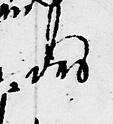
der
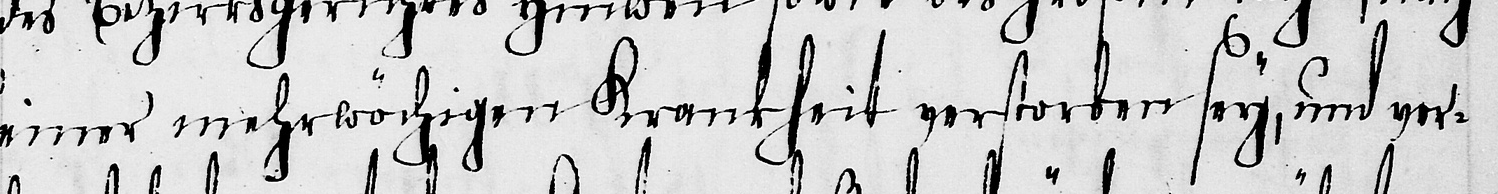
einer mehrwöchigen Krankheit verstorben sey, und ver¬
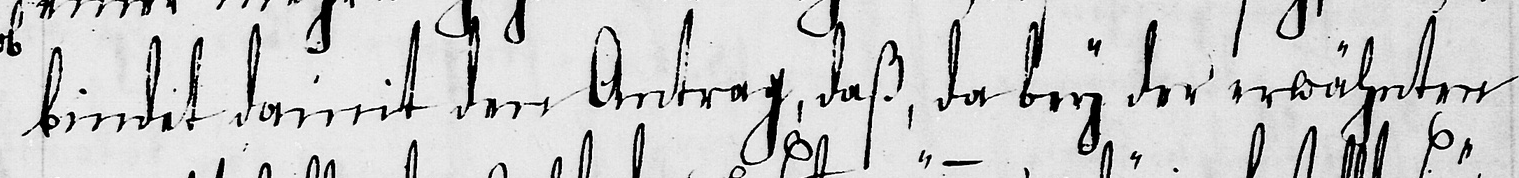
bindet damit den Antrag, daß, da bey der erwähnten
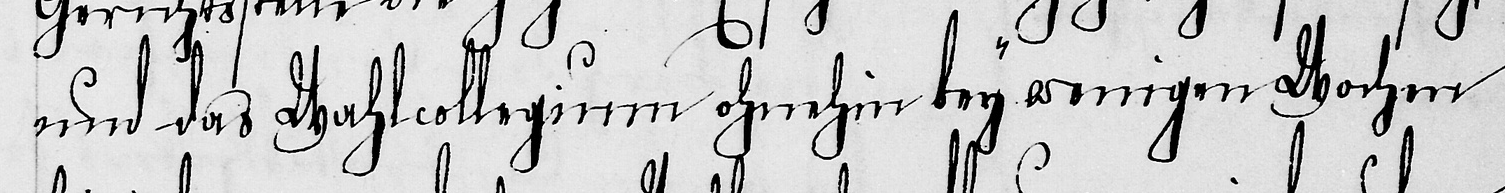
und das Wahlcollegium ohnehin bey wenigen Wochen
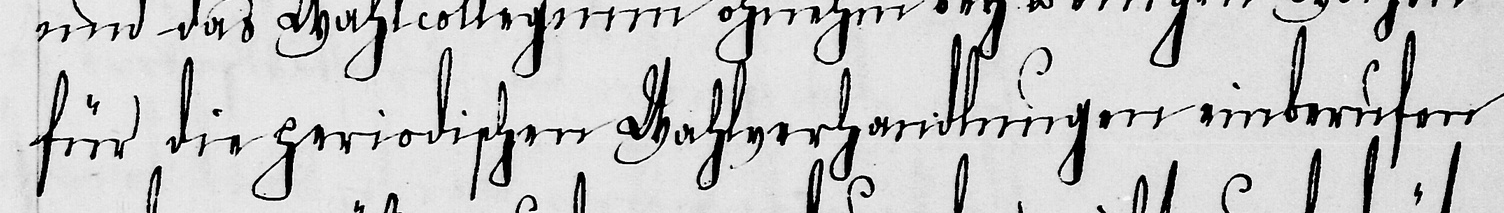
für die periodischen Wahlverhandlungen einberufen
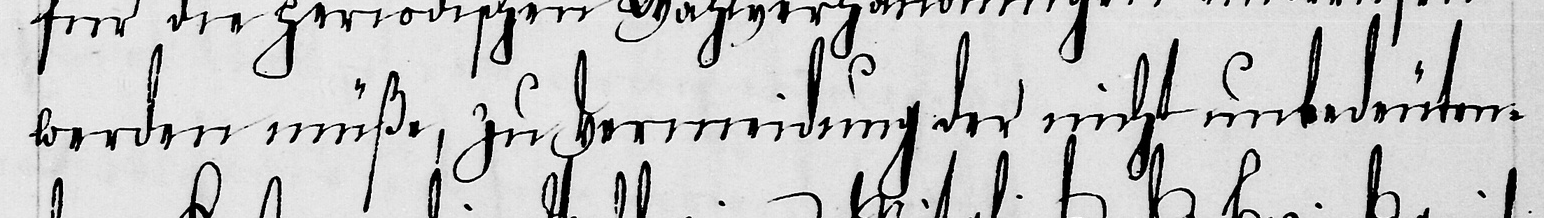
werden müße, zu Vermeidung der nicht unbedeuten¬
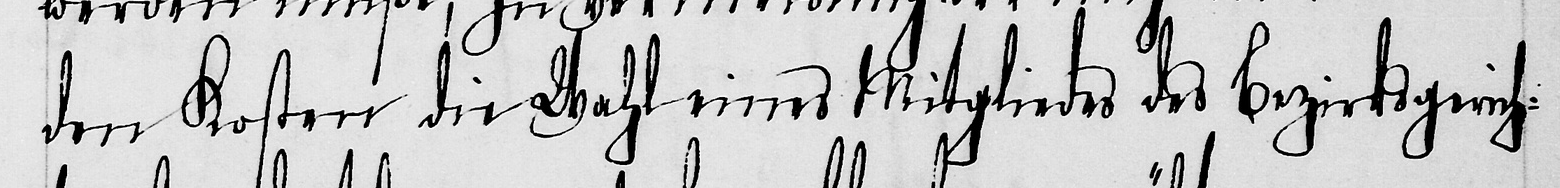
den Kosten die Wahl eines Mitgliedes des Bezirksgerich¬
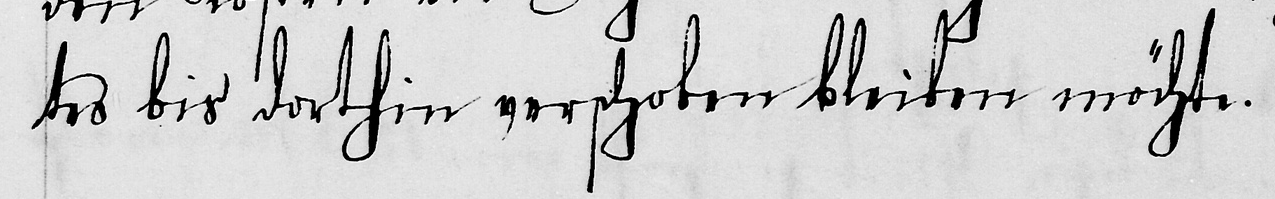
tes bis dorthin verschoben bleiben möchte.
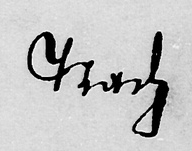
Nach
